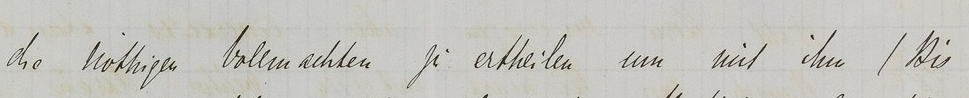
die nöthigen Vollmachten zu ertheilen um mit ihm (Bis-
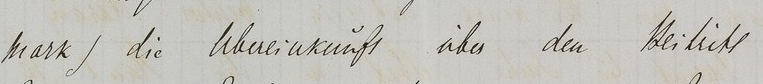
mark) die Übereinkunft über den Beitritt
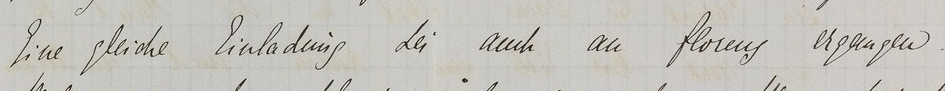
Eine gleiche Einladung sei auch an Florenz ergangen.
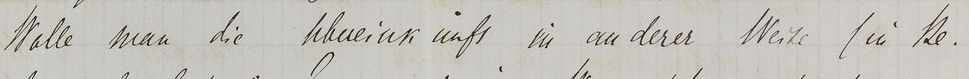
Wolle man die Übereinkunft in anderer Weise (in Be-
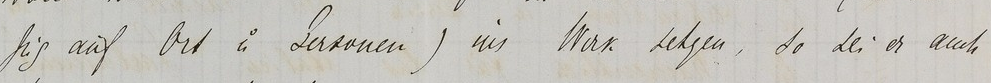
zug auf Ort u Personen) ins Werk setzen, so sei er auch
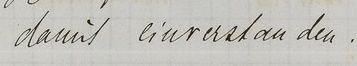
damit einverstanden.
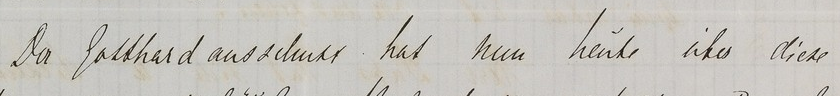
Der Gotthardausschuss hat nun heute über diese
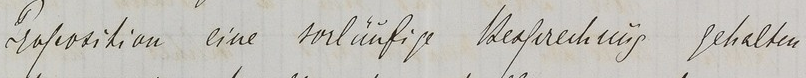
Proposition eine vorläufige Besprechung gehalten
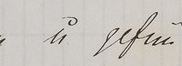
u gefun-
